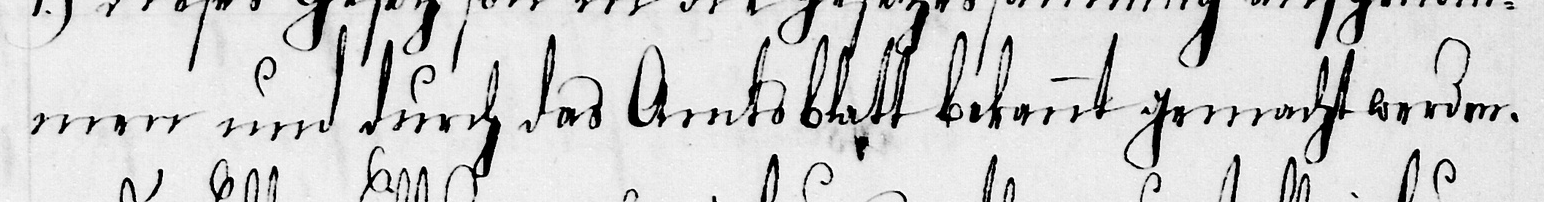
men und durch das Amtsblatt bekannt gemacht werden.
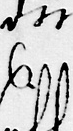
2.)
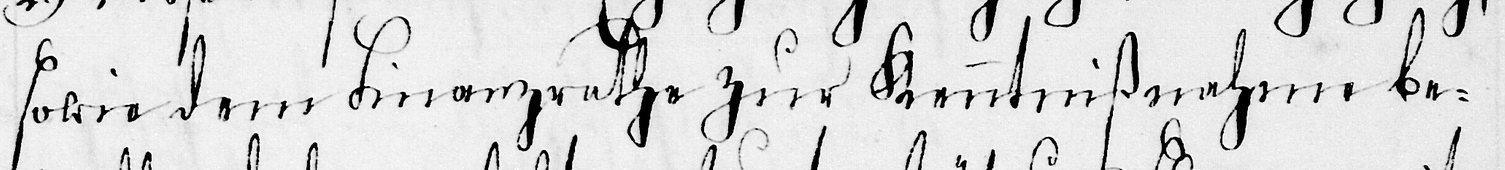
sowie dem Finanzrathe zur Kenntnißnahme be¬
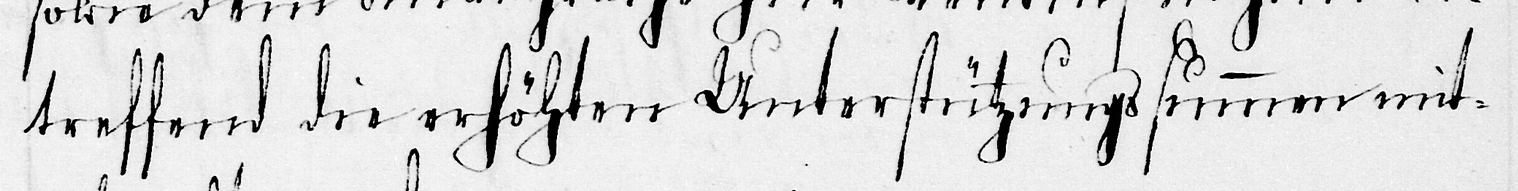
treffend die erhöhten Unterstützungssummen mit¬
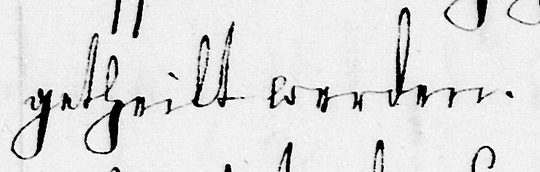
getheilt werden.
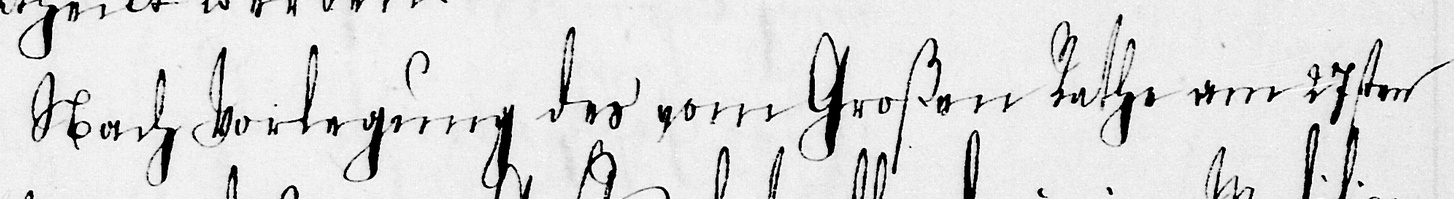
Nach Vorlegung des vom Großen Rathe am 27sten
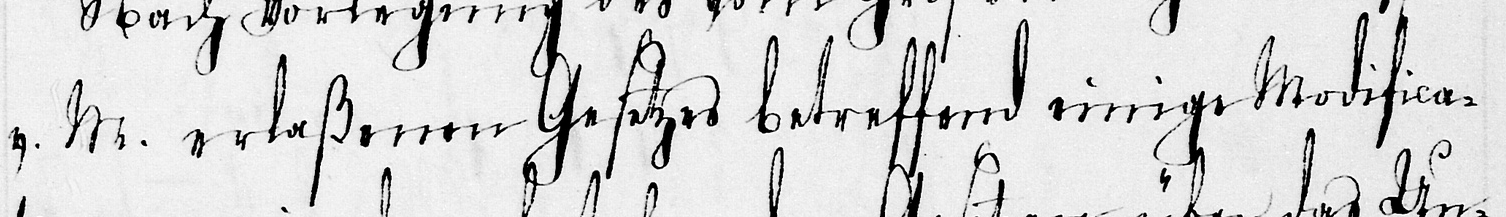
v. M. erlaßenen Gesetzes betreffend einige Modifica¬
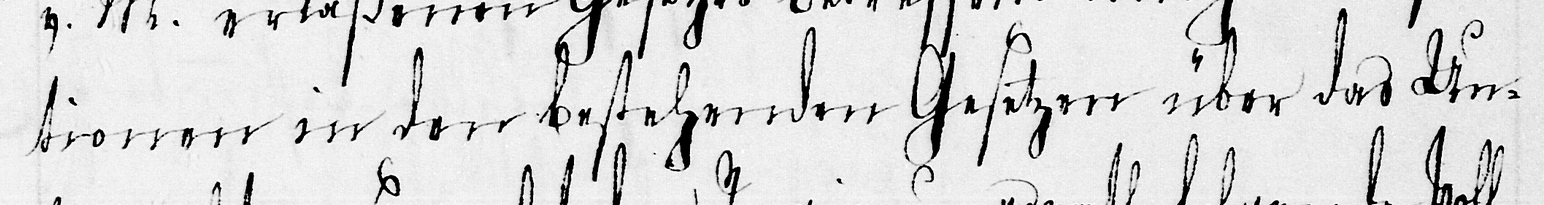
tionen in den bestehenden Gesetzen über das Un¬
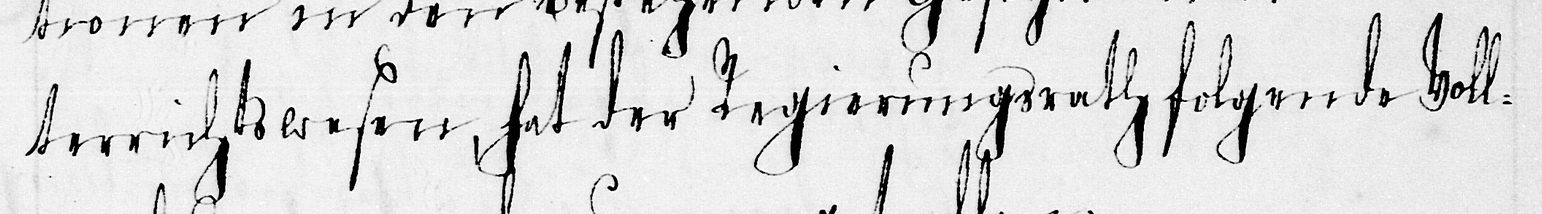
terrichtswesen, hat der Regierungsrath folgende Vol¬
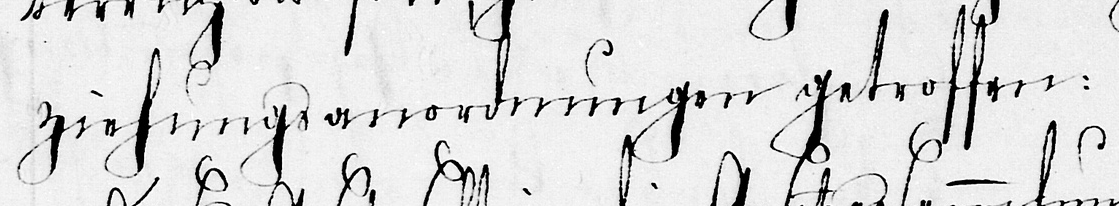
lziehungsanordnungen getroffen:
